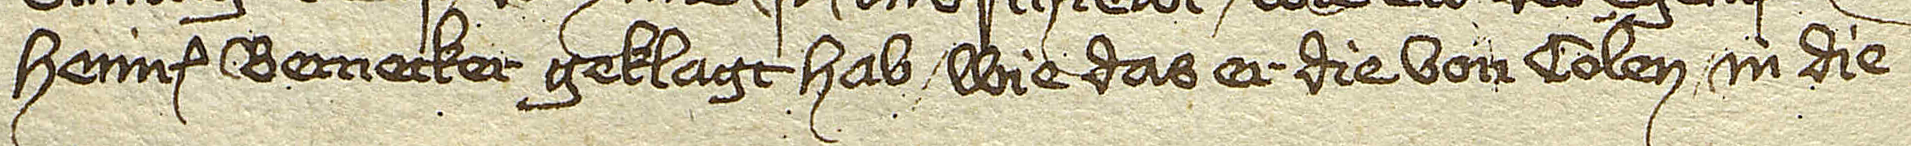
heinr* Bernecker geklagt hab / wie das er die von Colen in die
